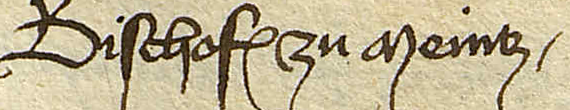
Biſchof cʒu Meintʒ /
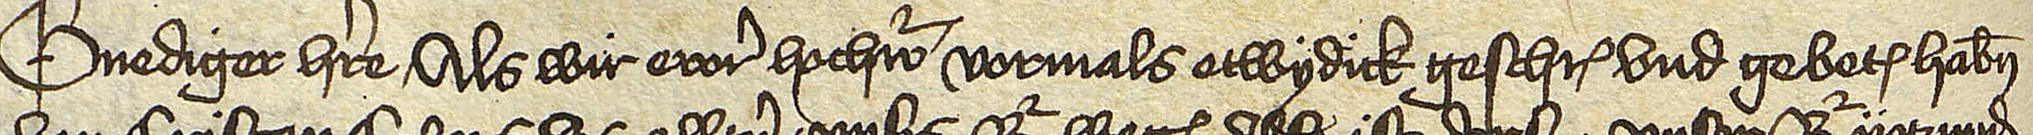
Gnediger h*re / Als wir ewr* hochw* vormals etwydick geſchr* vnd gebet* habn*
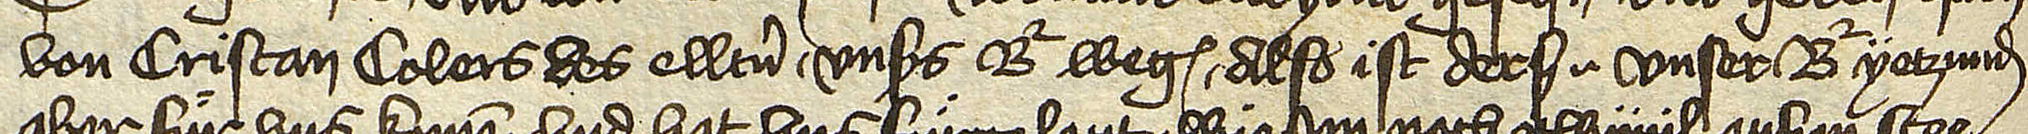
von Criſtan Colers des elltn* / vnſ*s B* weg* / Alſo iſt derſ* ~ vnſer B* yetʒund*
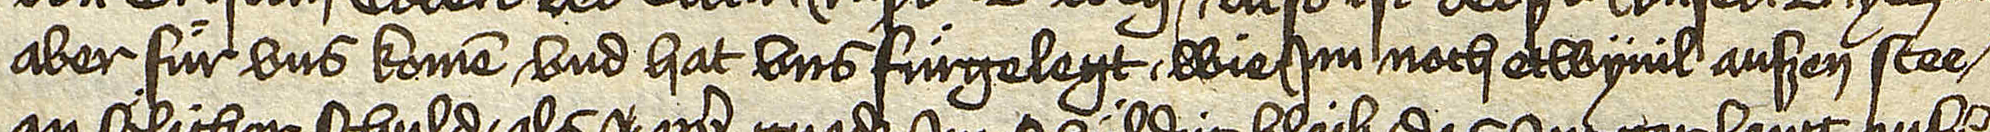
aber für vns kome* / vnd hat vns fürgelegt / wie Im noch etwyuil auſʒen ſtee
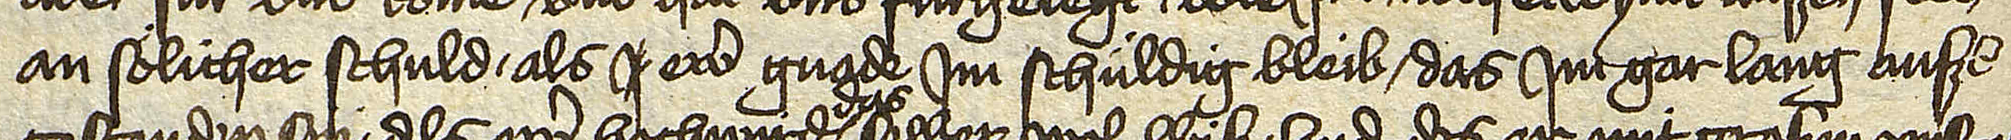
an ſölicher ſchuld / als I ew* gnade Im ſchüldig bleib / das Im gar lang auſʒe*
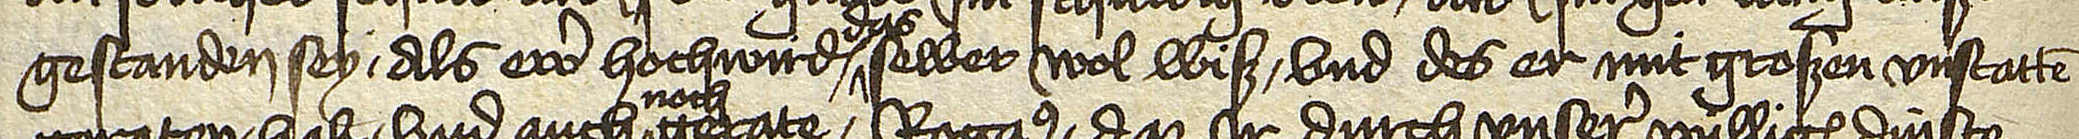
geſtanden ſey / Als ew* hochwird* ſelber wol wiſʒ / vnd des er mit groſʒen vnſtatte*
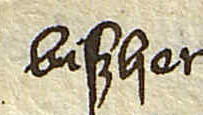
biſʒher
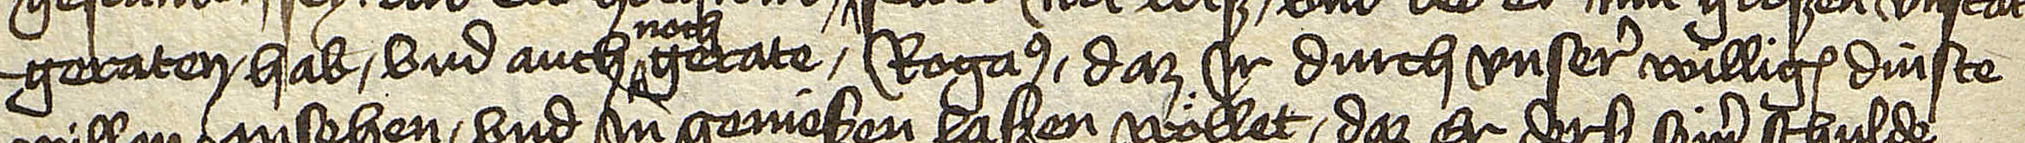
geraten / hab / vnd auch gerate / Roga* / daʒ Ir durch vnſer* willig* dinſte
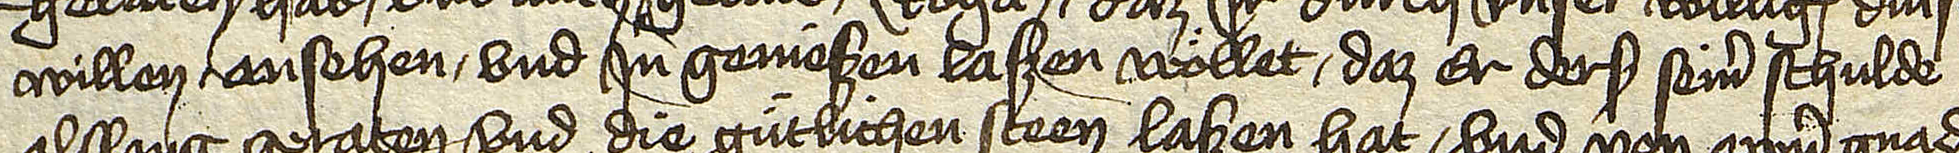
willen / anſehen / vnd In genieſʒen laſʒen wöllet / daʒ Er derſ* ſein* ſchulde
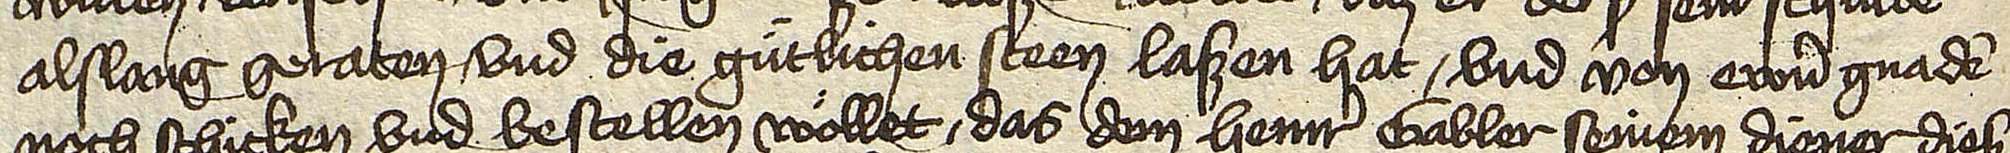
alſlang geraten / vnd die gütlichen ſteen laſʒen hat / vnd von ewn* gnade*
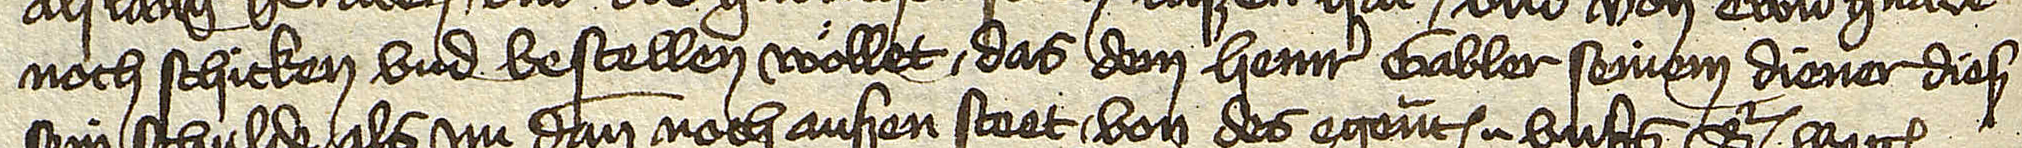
noch ſchicken vnd beſtellen wöllet / das dem heinr* Gabler ſeinem diener dieſ*
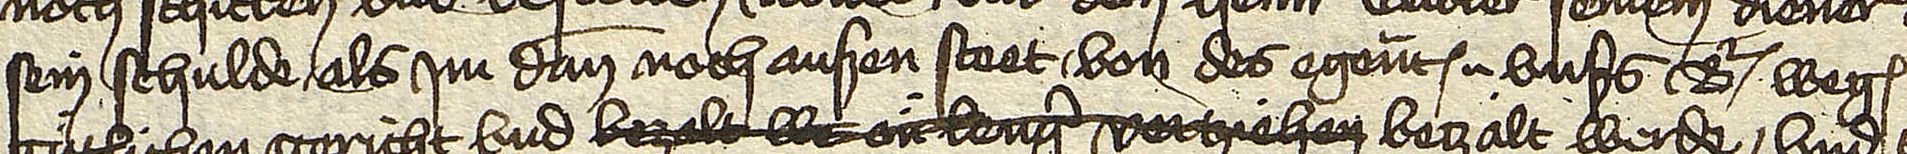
ſein ſchulde / als Im dan* noch auſʒen ſteet / von des egen*t* ~ vnſ*s B* / weg*
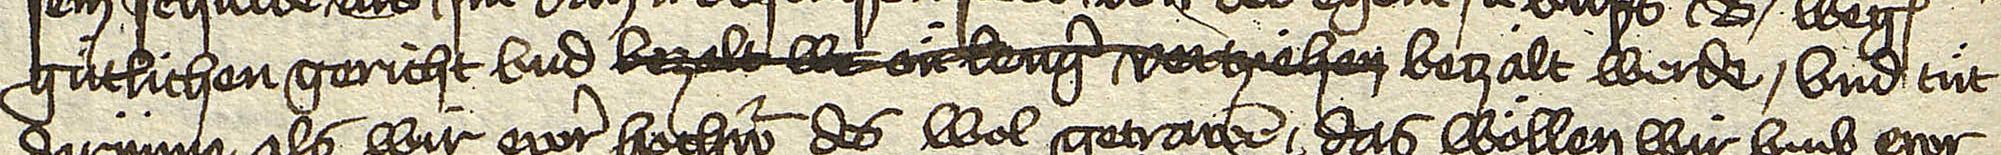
gütlichen gericht vnd beʒalt we önleng* vertʒiehen becʒalt werde / vnd tüt
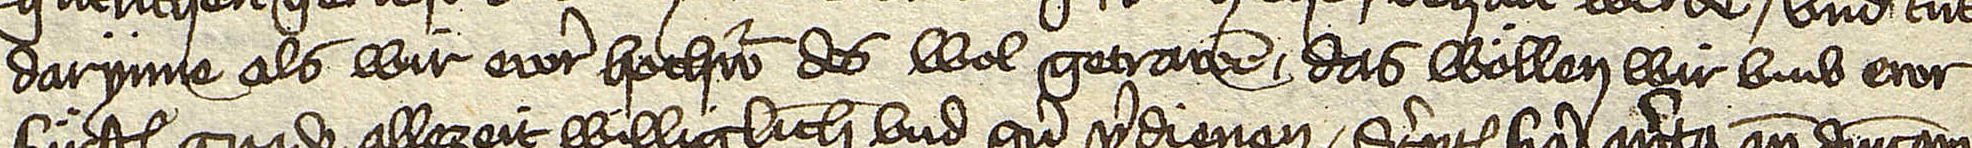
darynne als wir ewr* hochw* des wol getrawe* / das wöllen wir vmb ewr
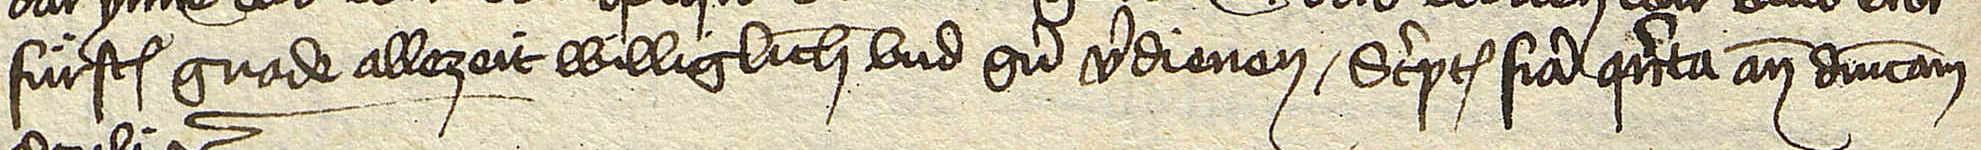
fürſt* gnade alleʒeit williglich* vnd gn* v*dienen / Scpt* fia* quta* an* dnicam*
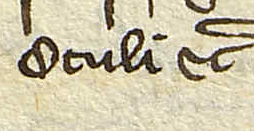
Oculi* ec*
